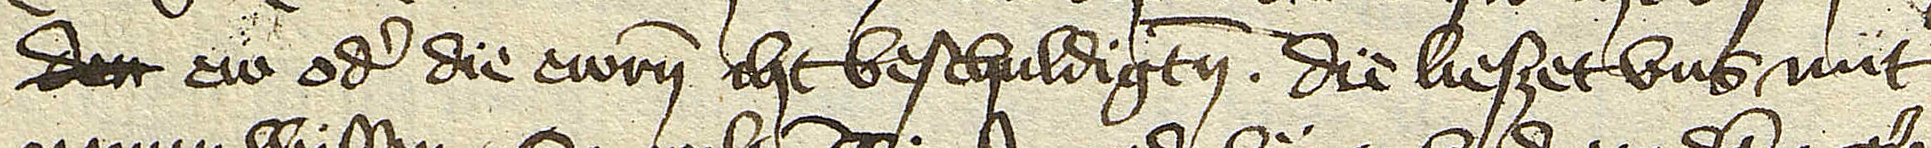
den ew od* die ewrn* iht beſchuldigtn* . die lieſʒet vns mit
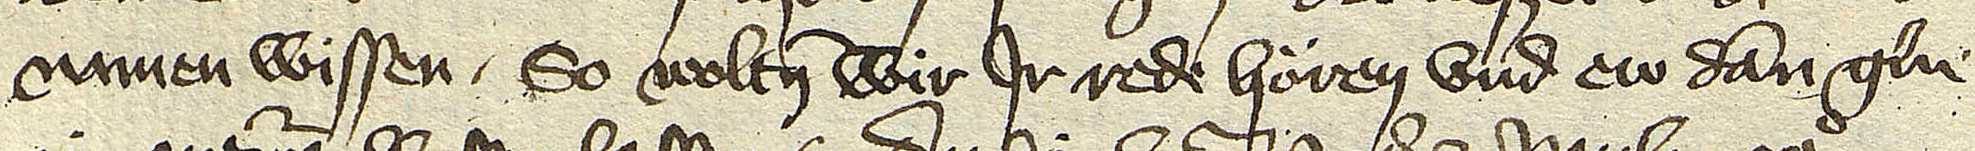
namen wiſſen / So woltn* wir Ir rede hören vnd ew dan* g*ne
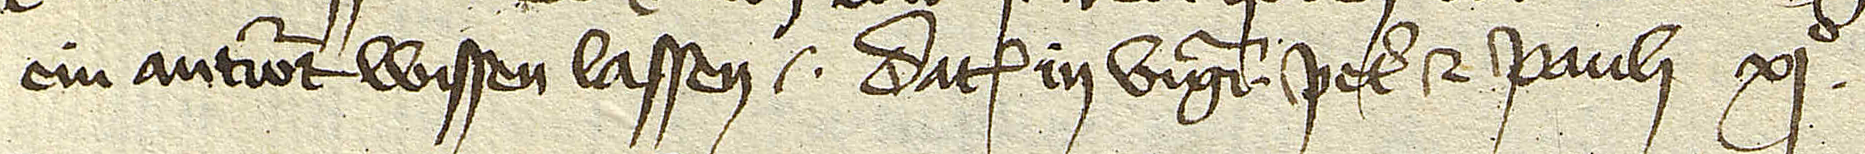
ein antwt* wiſſen laſſen / . Dat* in vigi* Pet* @ Pauli xi* .
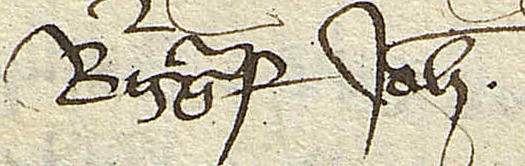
B*gg*f Ioh* .
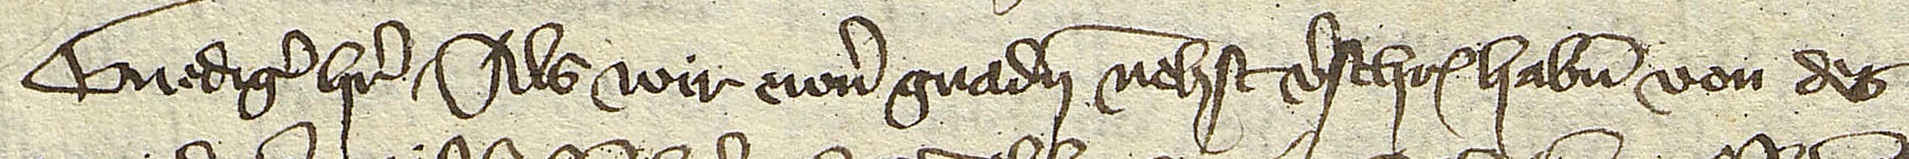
Gnedig* hr* / Als wir ewn* gnadn* nehſt v*ſchr* habn* von des
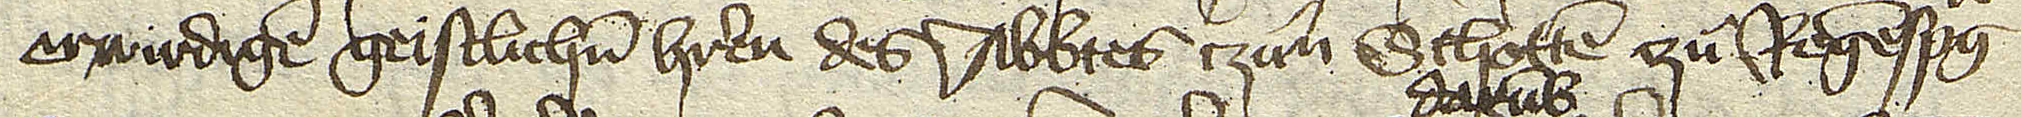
erwirdige* geiſtlichn* hr*en des Abbtes cʒün Schotte* cʒü Rege*ſp*g
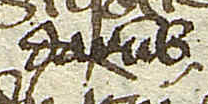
darub*
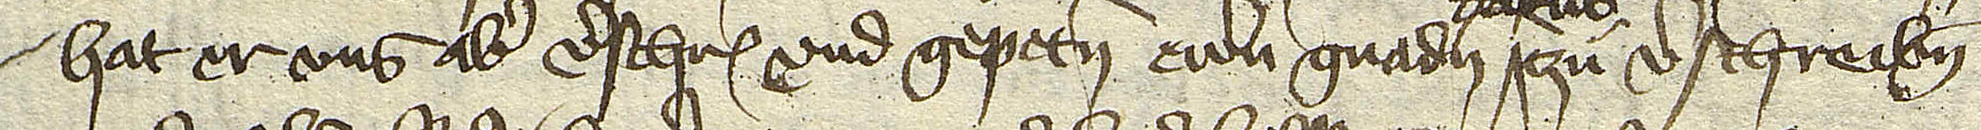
hat er vns ab* v*ſchr* vnd gepetn* ew*n gnadn* cʒü v*ſchreibn*
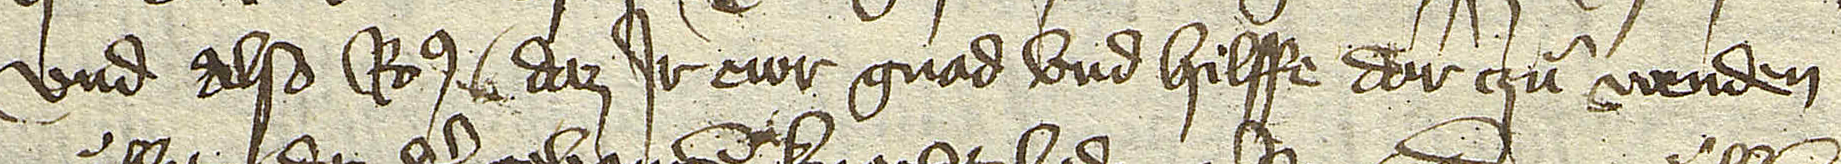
vnd Alſo Ro* / daʒ Ir ewr gnad vnd hilffe dar cʒü wenden
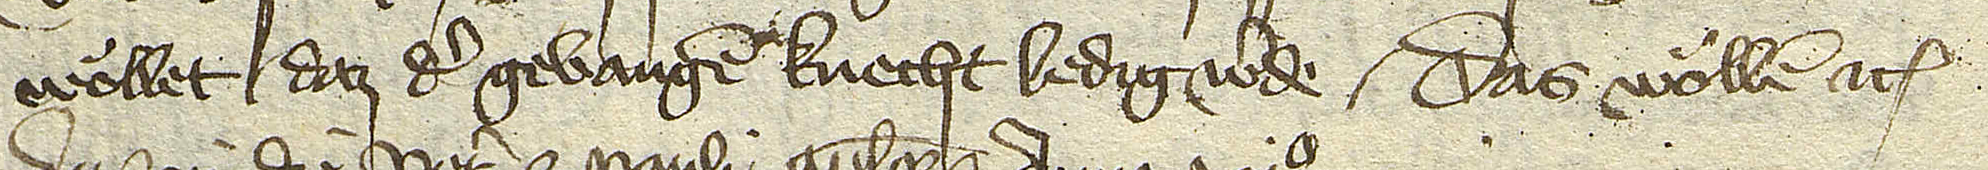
wöllet / daʒ d* gevange* knecht ledig w*de / Das wölle* ec*
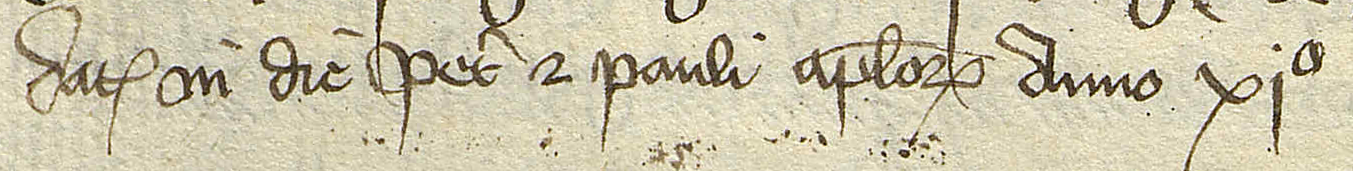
dat* in die Pet* @ Pauli Aplo* Anno xi*
